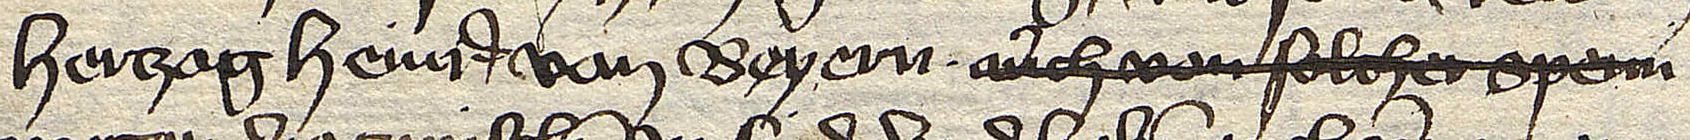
hercʒog heinr* von Beyern . auch von ſolcher Spenn
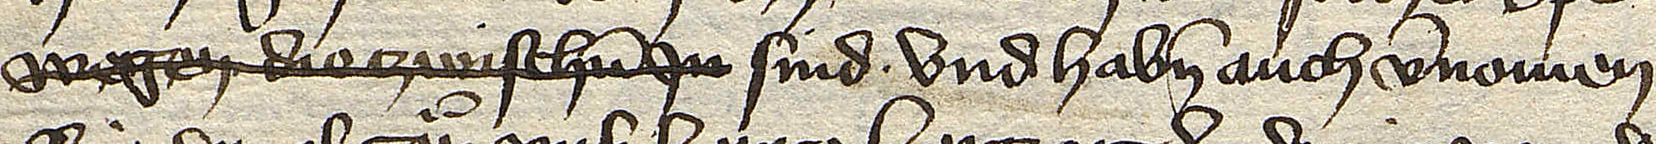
wegen . die cʒwiſchn* In ſind . vnd habn* auch v*nomen
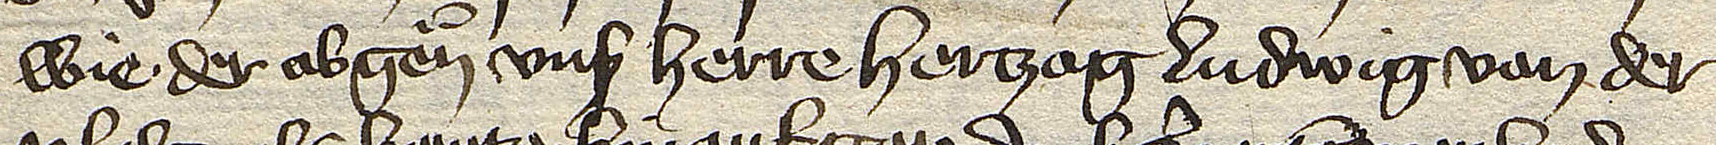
wie . der obgen* vnſ* herre hercʒog Ludwig von der
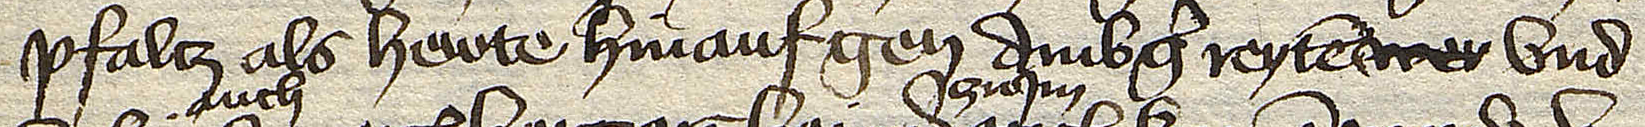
Pfalcʒ als hewte hinauf gen Amb*g reyte* wer vnd
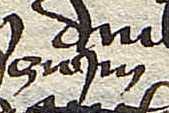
cʒu Im
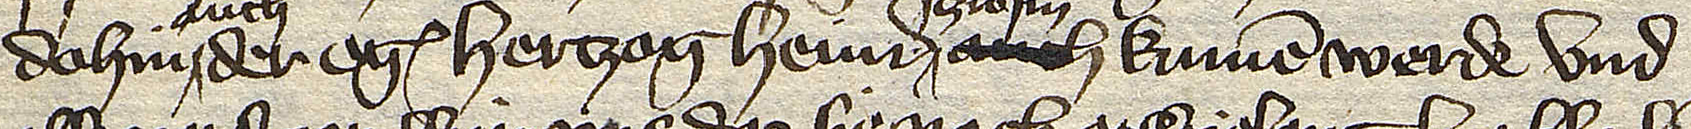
dohin der eg* hercʒog heinr* auch kume* werde vnd
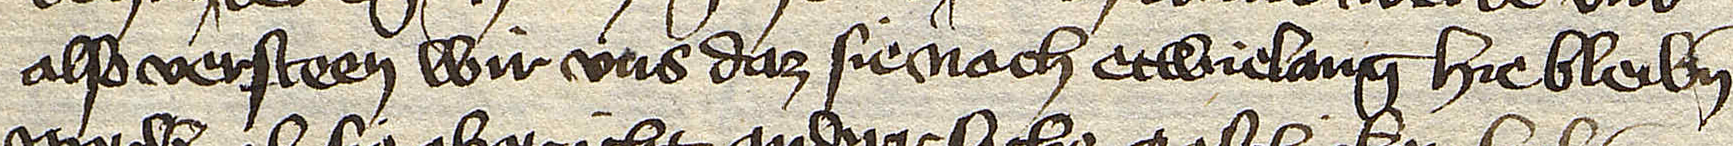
alſo verſteen wir vns daʒ ſie noch etwielang hie bleibn*
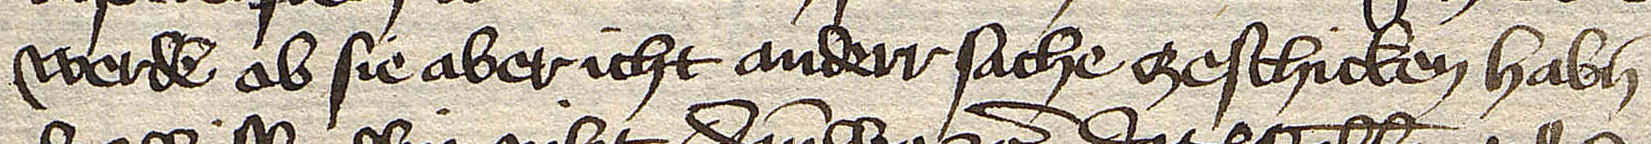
werde* ob ſie aber icht anderr ſache cʒeſchicken habn*
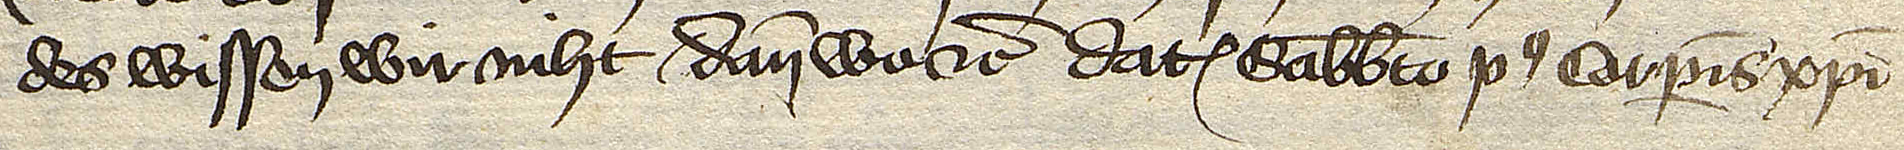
des wiſſen wir niht / dan* wo ec* dat* Sabbto* p* Corpis* xpi*
